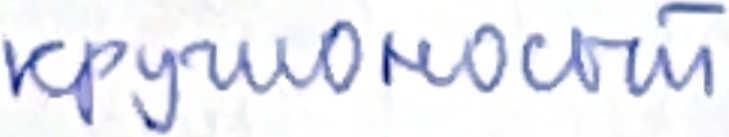круглоносый
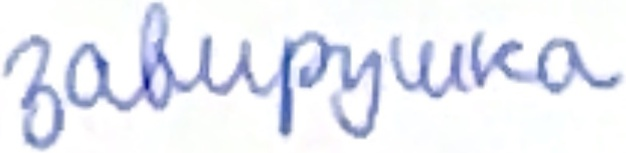завирушка
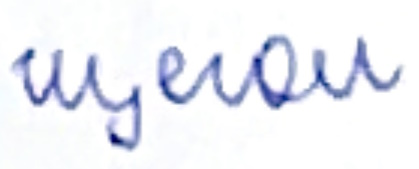щегол
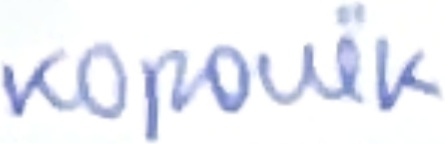королёк
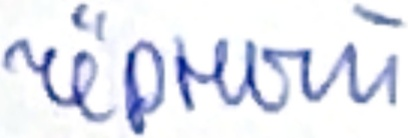чёрный
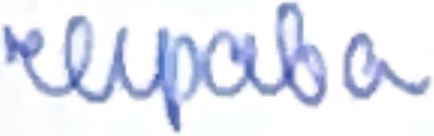чеграва
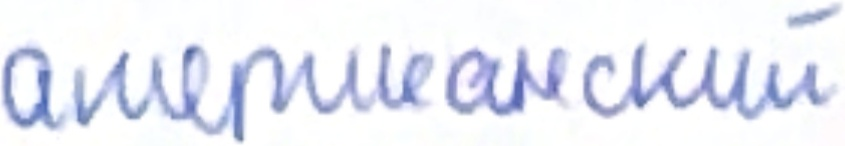американский
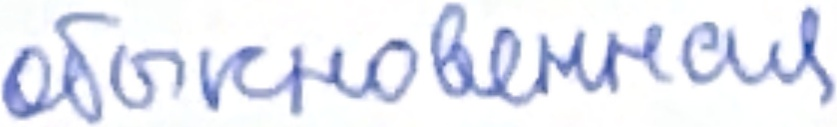обыкновенная
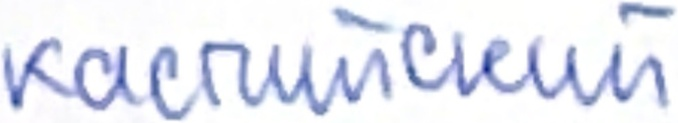каспийский
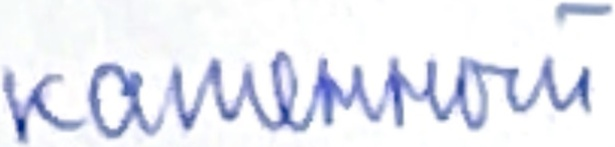каменный
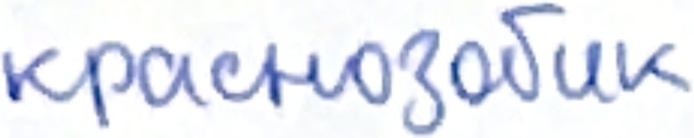краснозобик
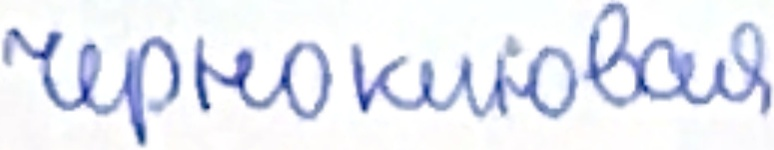черноклювая
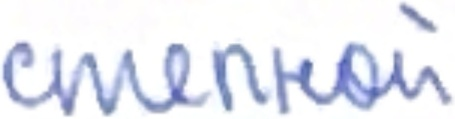степной
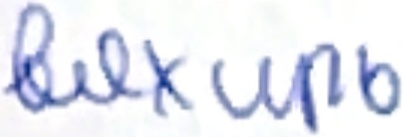вяхирь
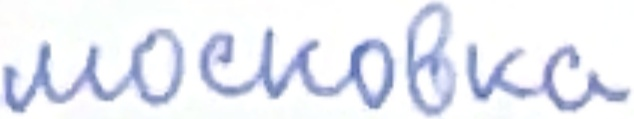московка
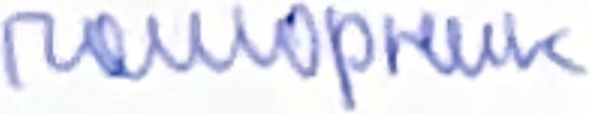поморник
